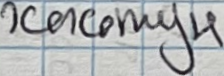хохотун
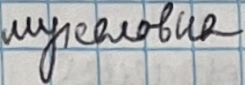мухоловка
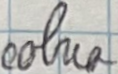совка
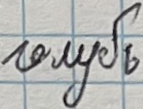голубь
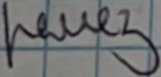ремез
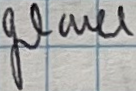дятел
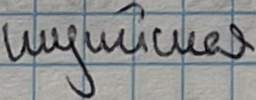индийская
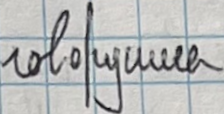говорушка
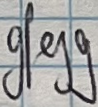дрозд
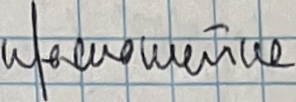красношейка
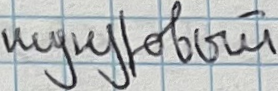тундровый
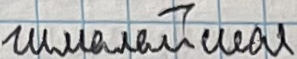гималайская
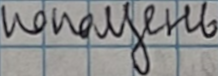поползень
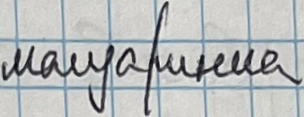мандаринка
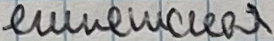египетская
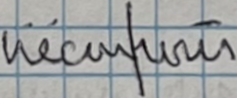пёстрый
